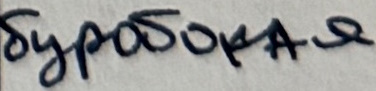буробокая
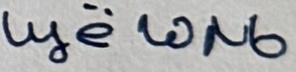щёголь
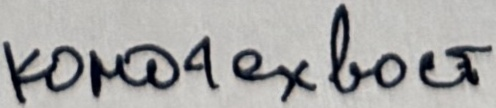колючехвост
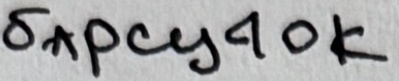барсучок
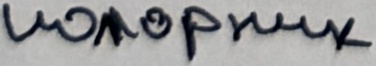поморник
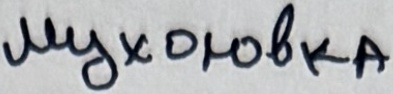мухоювка
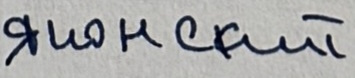японский
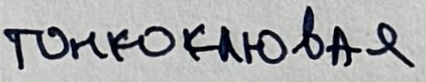тонкоклювая
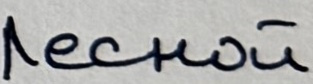лесной
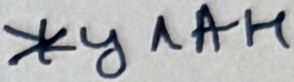жулан
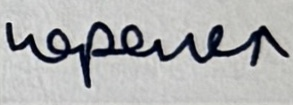перепел
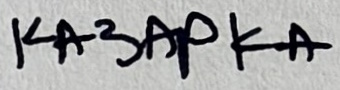казарка
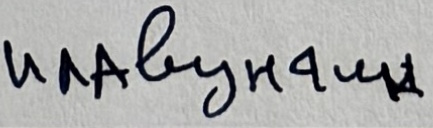плавунчик
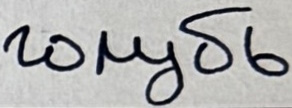голубь
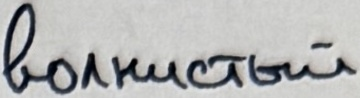волнистый
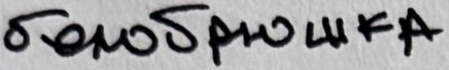белобрюшка
